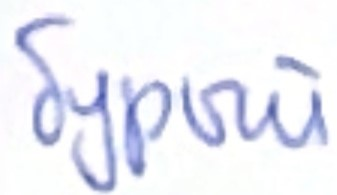бурый
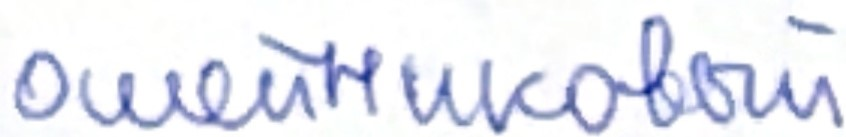ошейниковый
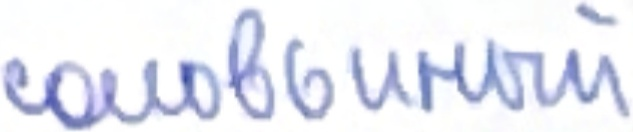соловьиный
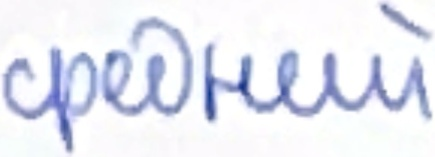средний
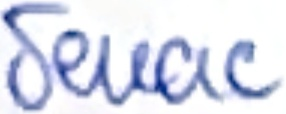бекас
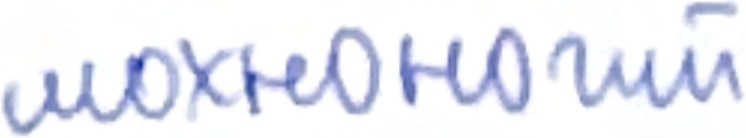мохноногий
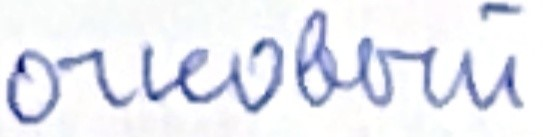очковый
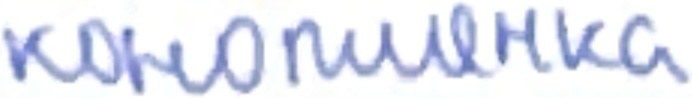коноплянка
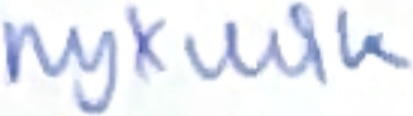пухляк
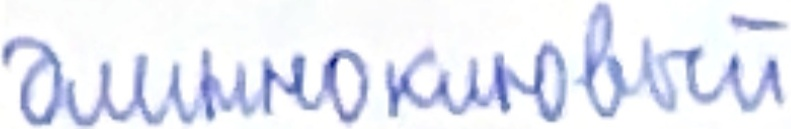длинноклювый
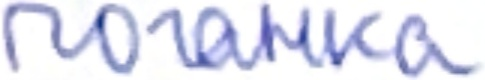поганка
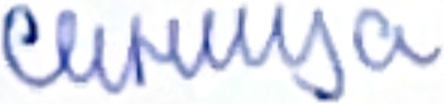синица
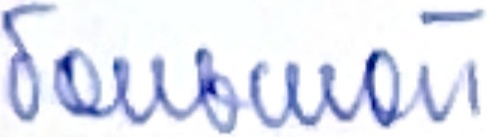большой
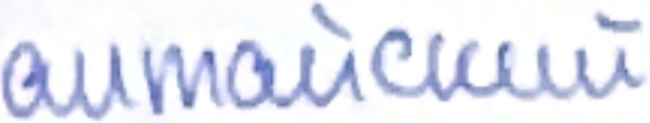алтайский
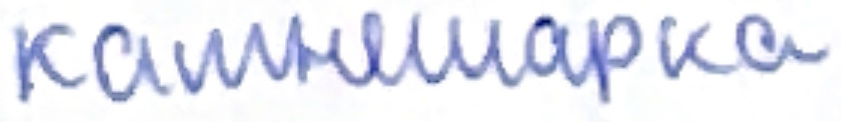камнешарка
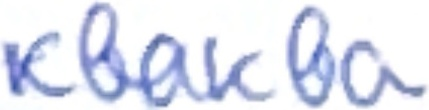кваква
